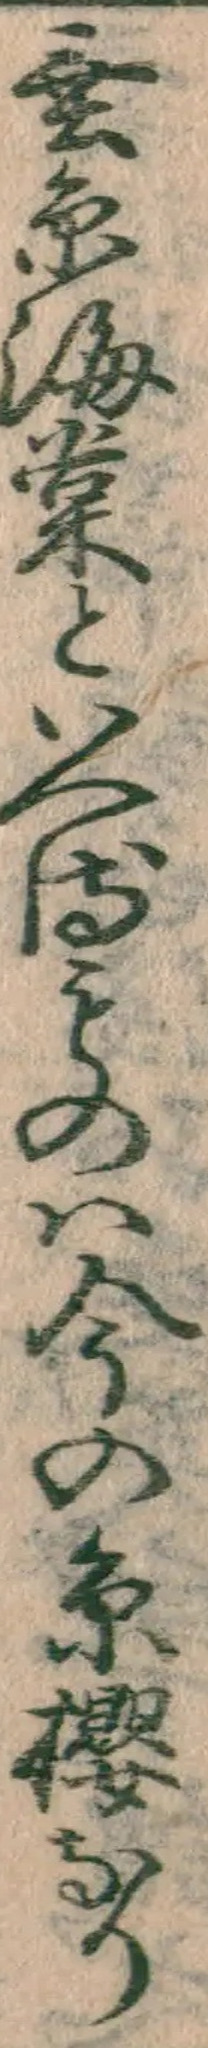垂糸海棠といへるものは今の糸桜なり
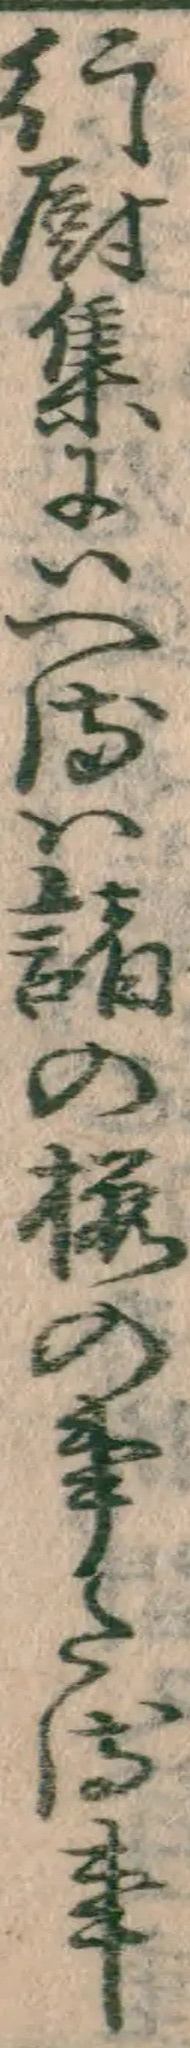行厨集にいへるは諸の桜の事たる事
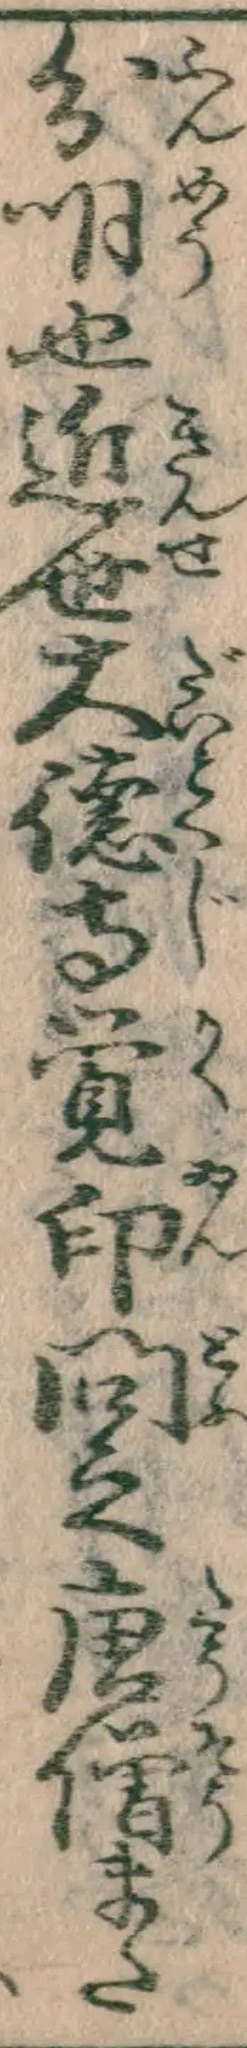分明也近世大徳寺覚印問之唐僧また
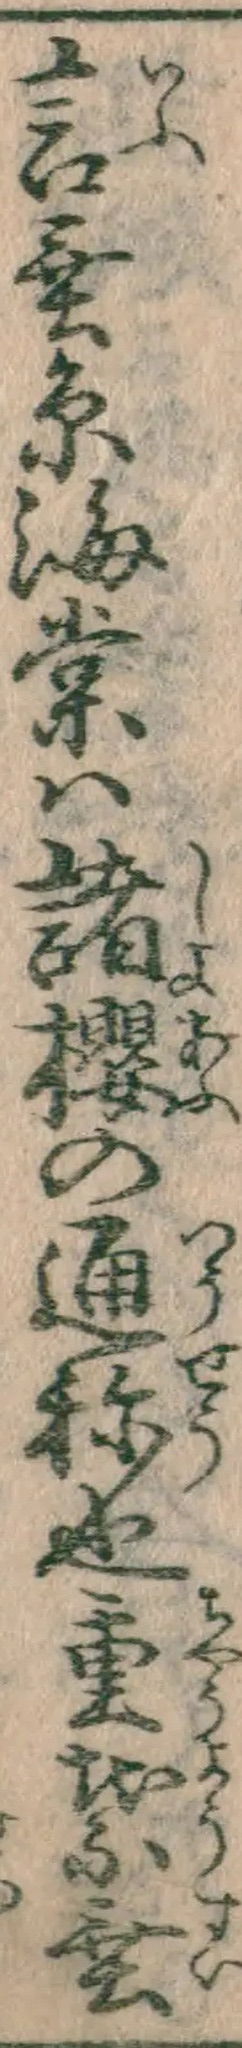言垂糸海棠は諸桜の通称也重葉垂
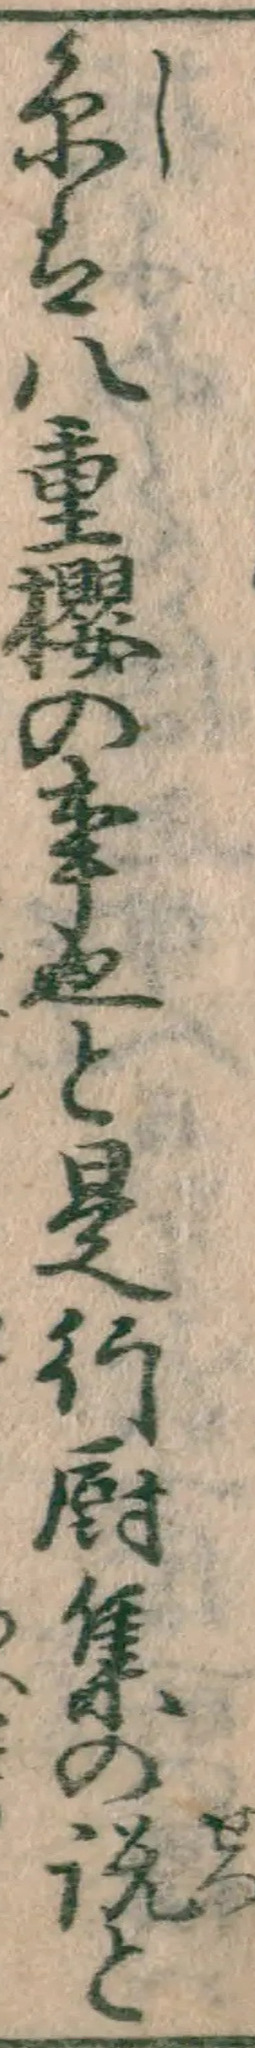糸は八重桜の事也と是行厨集の説と
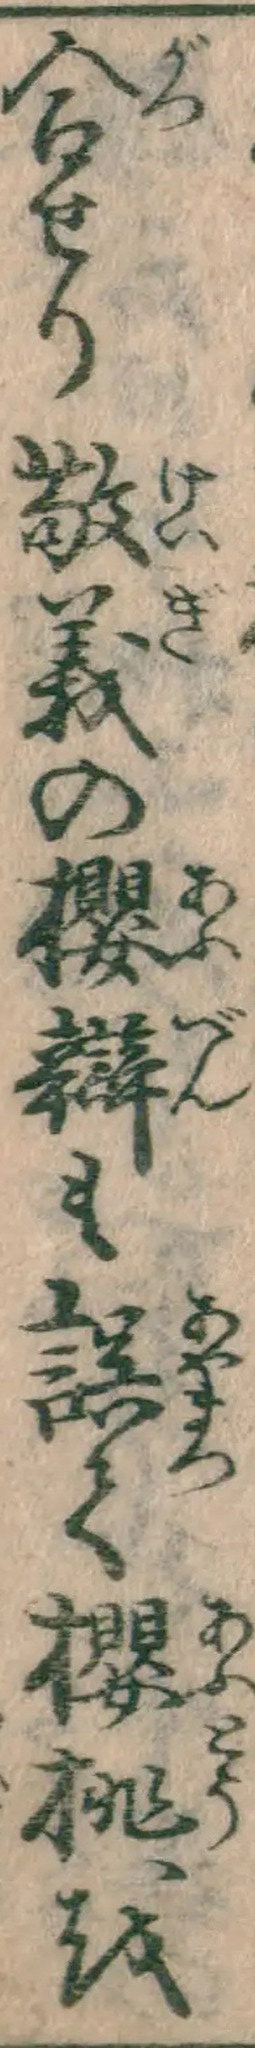合せり敬義の桜辯も誤て桜桃を
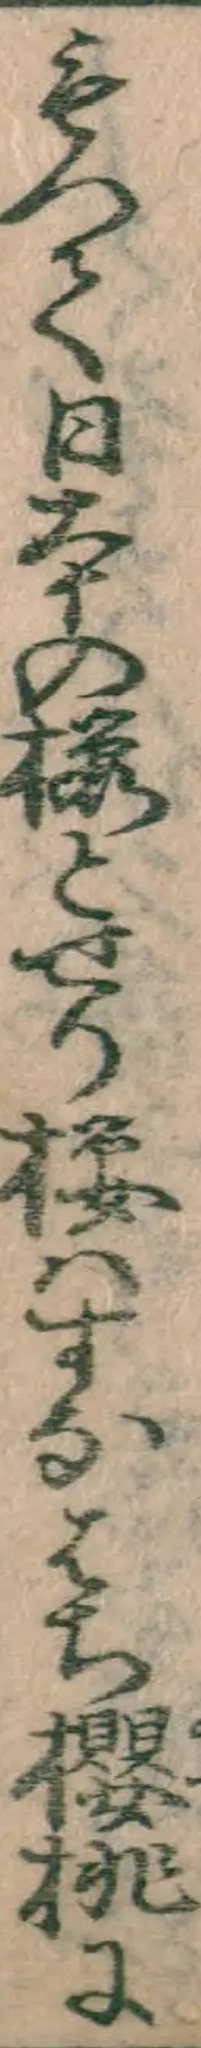もつて日本の桜とせり桜はすなはち桜桃に

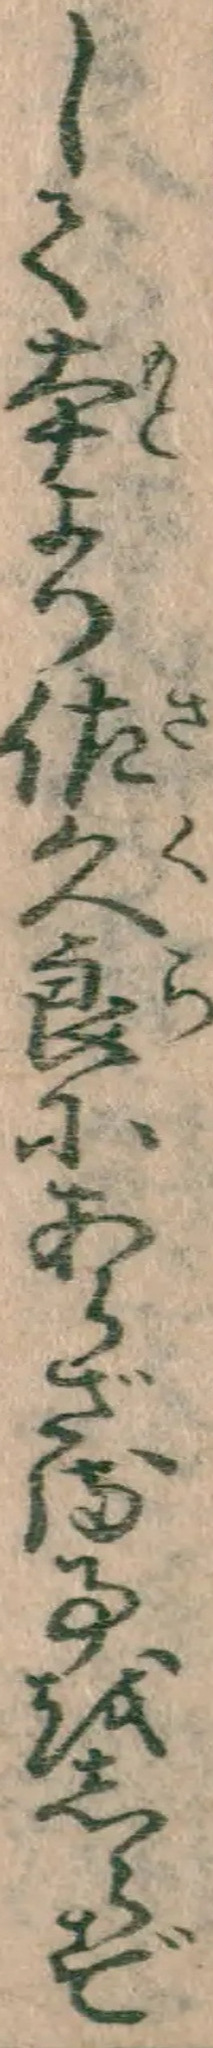して本より佐久良にあらざる事をしらず
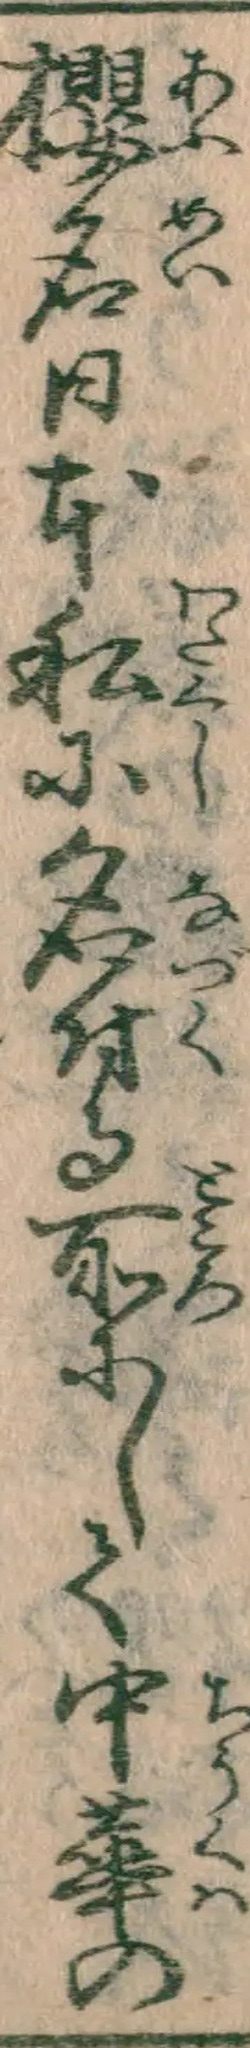桜名日本私に名付る所にして中華の
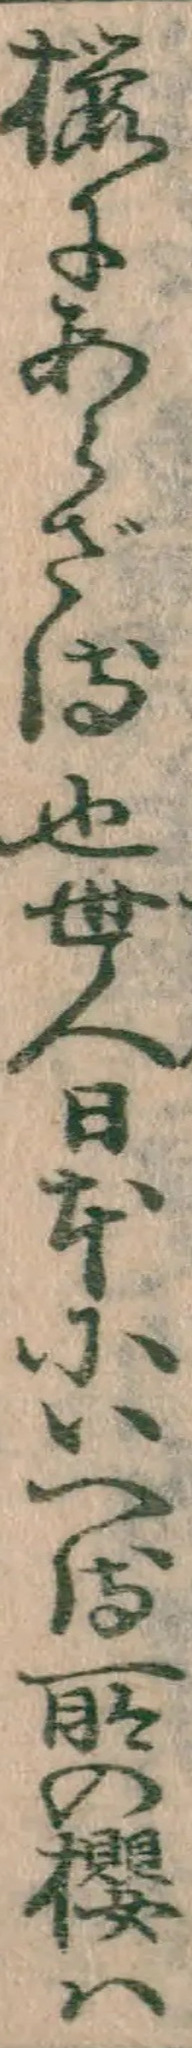桜にあらざる也世人日本にいへる所の桜は
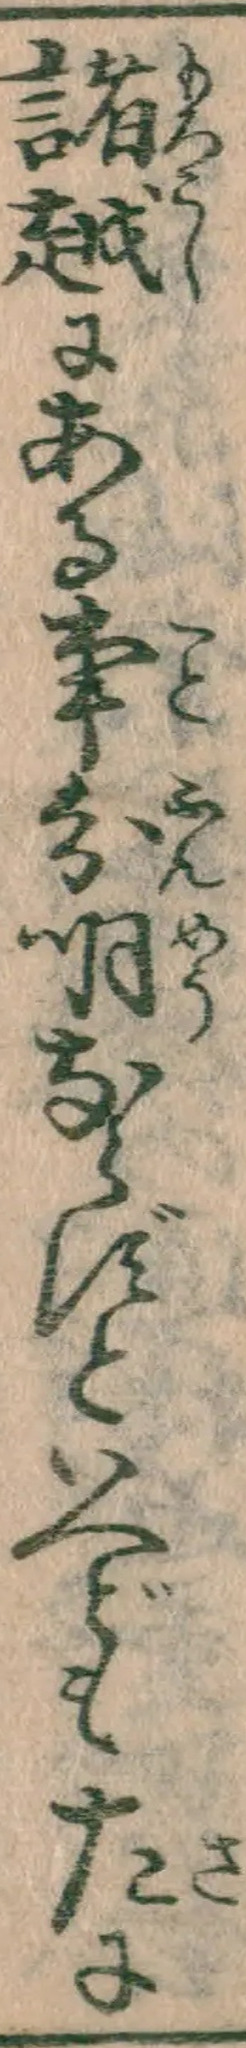諸越にある事分明ならずといへども左に
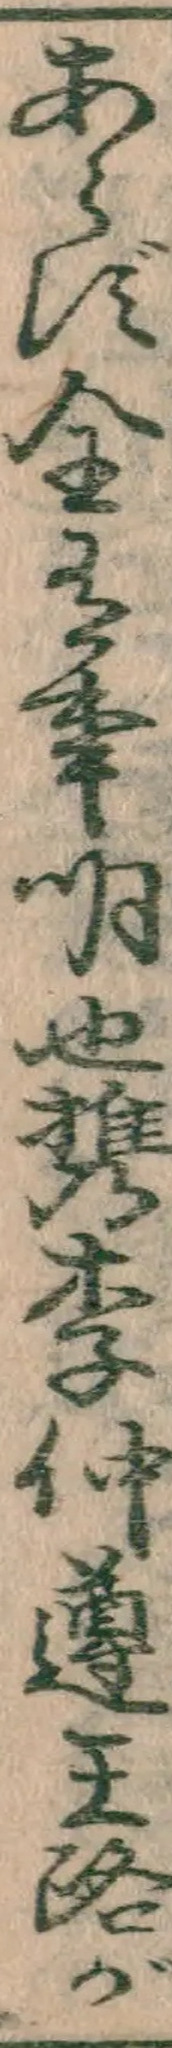あらず全有事明也携李仲遵王路が
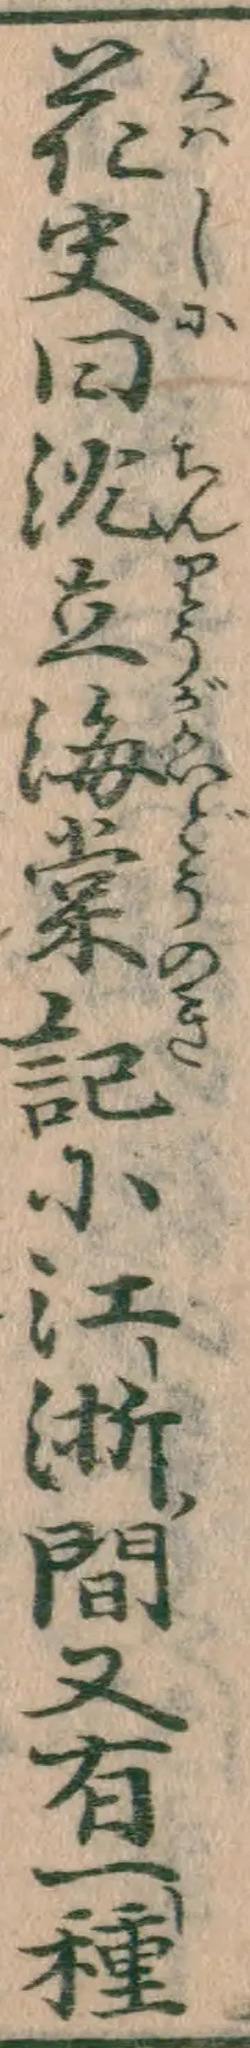花史曰沈立海棠記に江-浙間又有一-種
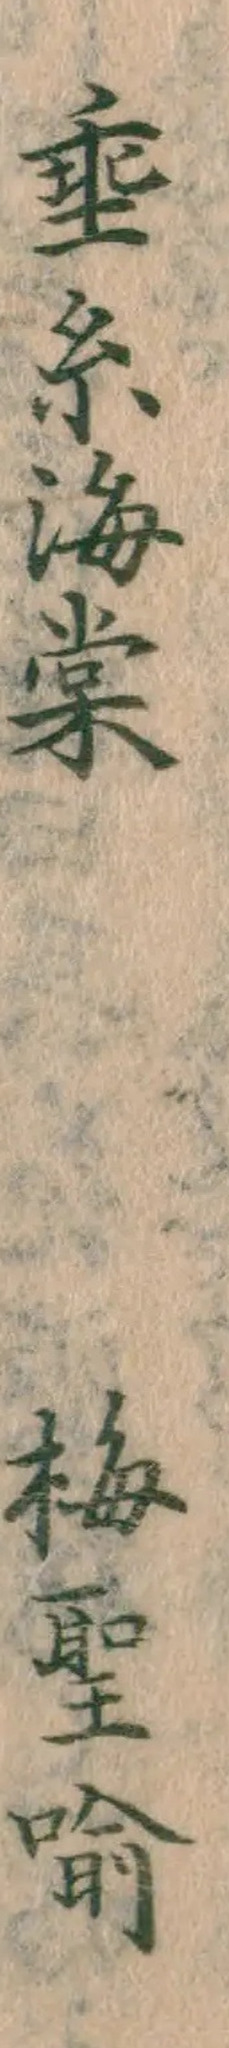垂糸海棠梅聖喩

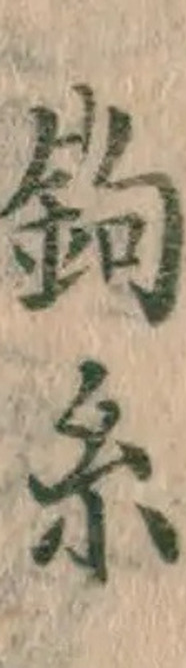-鉤糸
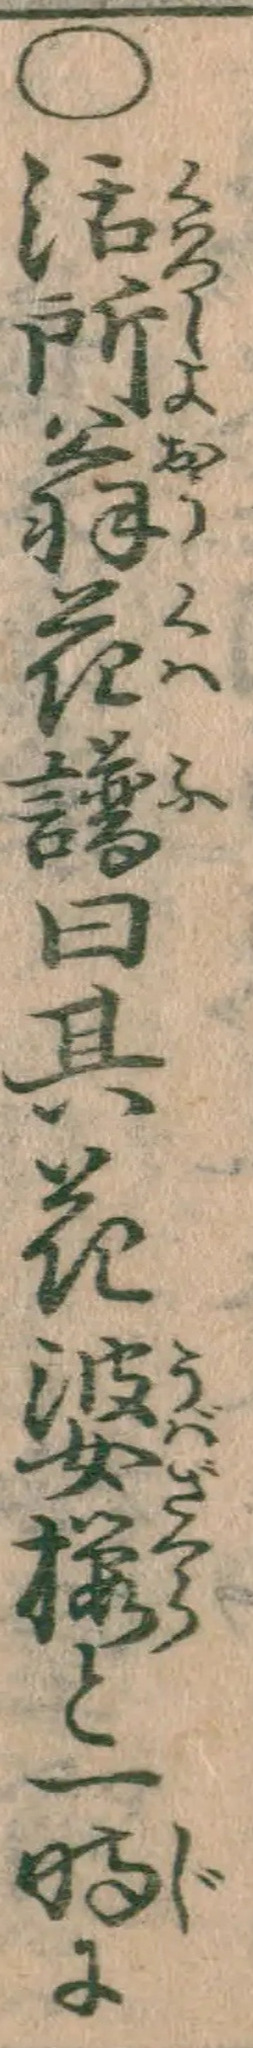○活所翁花譜曰其花婆桜と一時に
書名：怡顔齋櫻品
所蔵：国立国会図書館 National Diet Library, JAPAN
